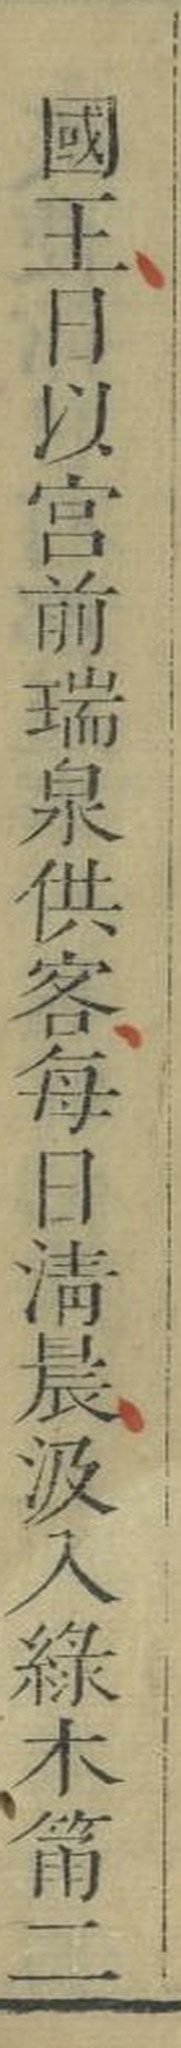國王日以宫前瑞泉供客每日淸晨汲入綠木筩二
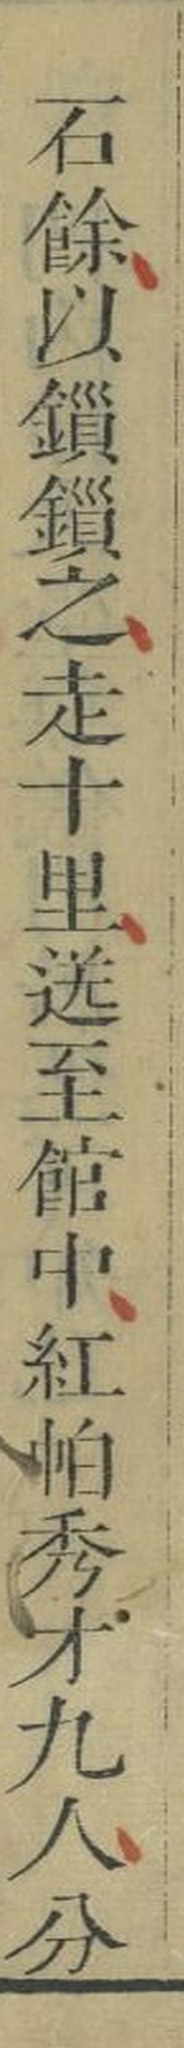石餘以鎻鎻之走十里送至館中紅帕秀才九人分
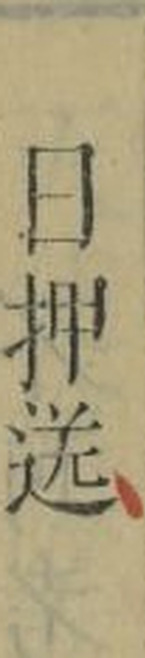日押送
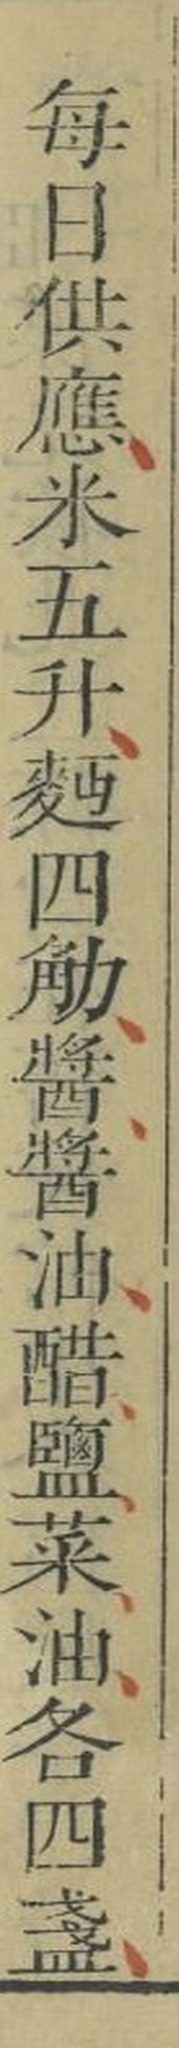每日供應米五升麪四觔醬醬油醋鹽菜油各四盞
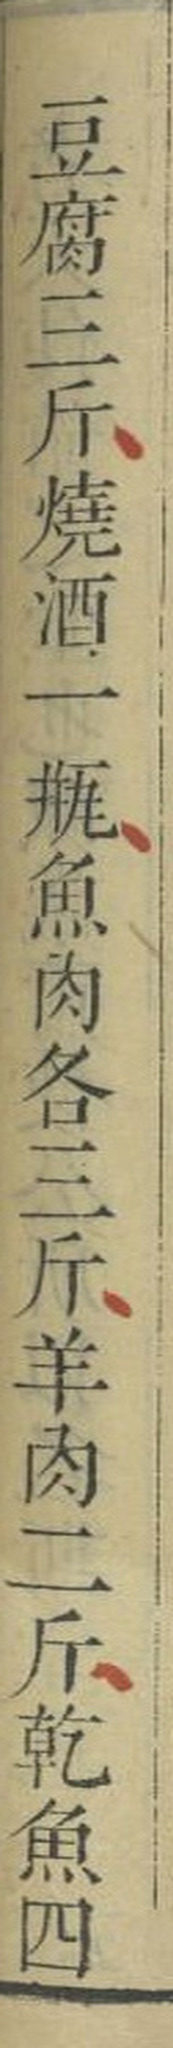豆腐三斤燒酒一甁魚肉各三斤羊肉二斤乾魚四
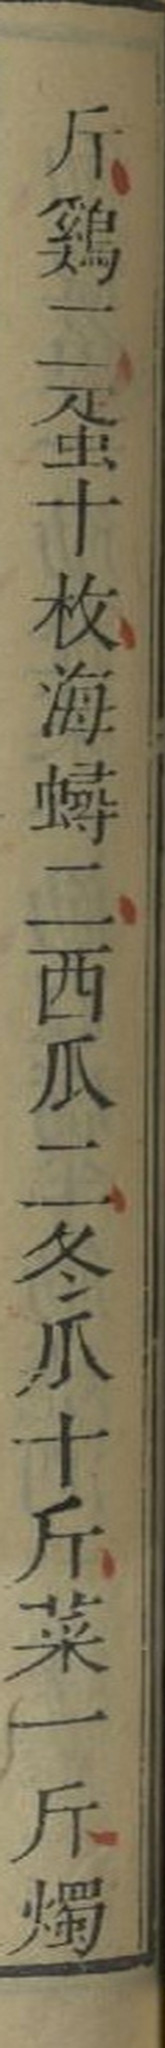斤鷄二蛋十枚海蟳二西瓜二冬瓜十斤菜一斤燭
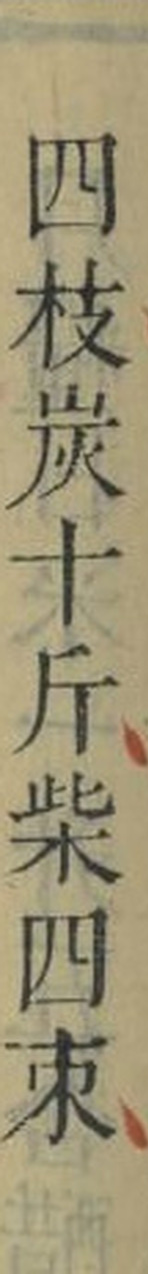四枝炭十斤柴四束
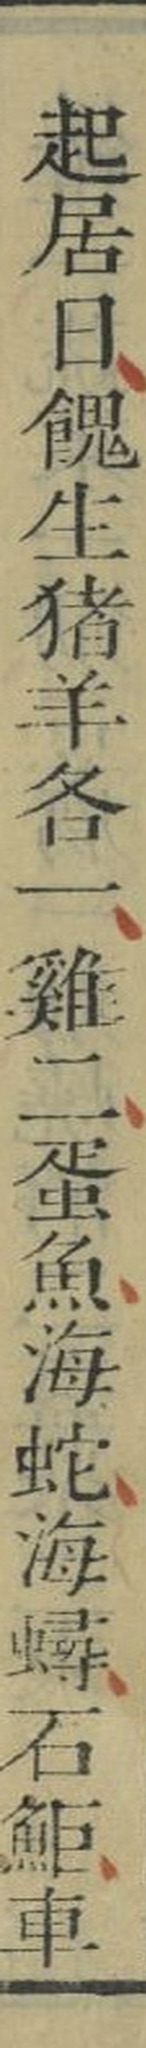起居日餽生猪羊各一雞二蛋魚海蛇海蟳石鮔車
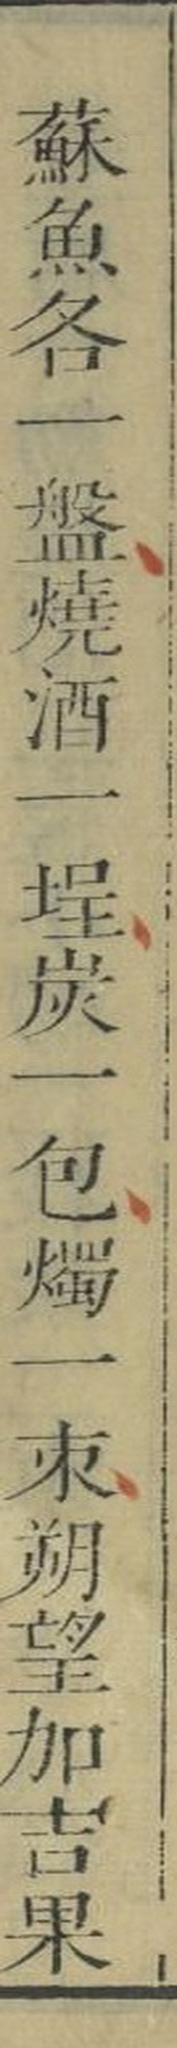蘇魚各一盤燒酒一埕炭一包燭一束朔望加吉果
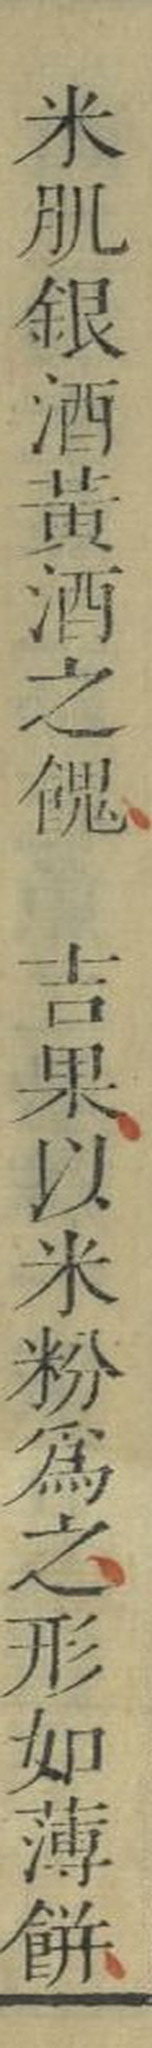米肌銀酒黃酒之餽吉果以米粉爲之形如薄餅
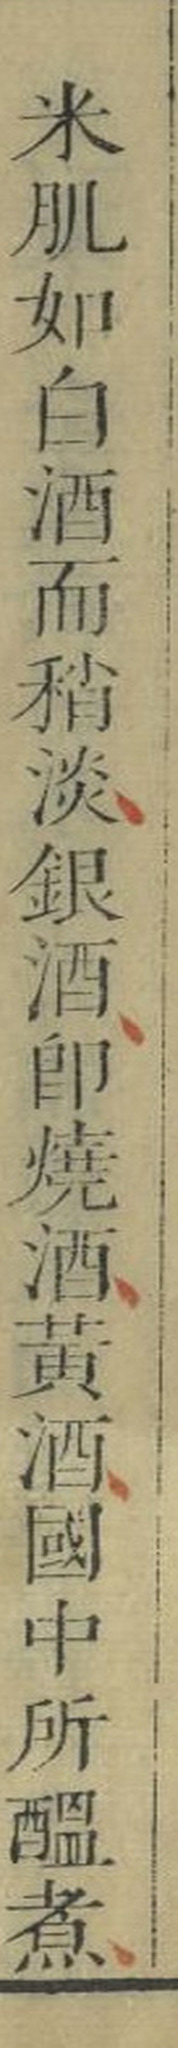米肌如白酒而稍淡銀酒卽燒酒黃酒國中所醞煮
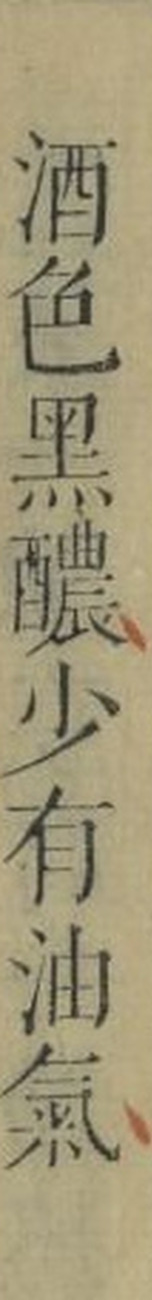酒色黑醲少有油氣
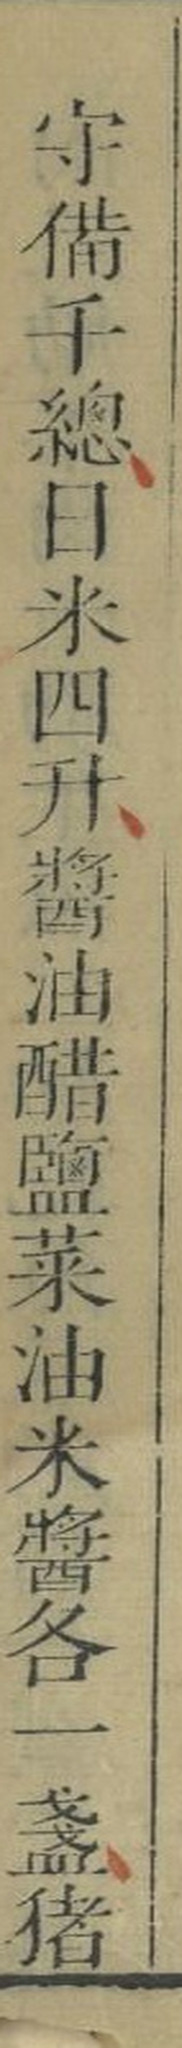守備千總日米四升醬油醋鹽菜油米醬各一盞猪

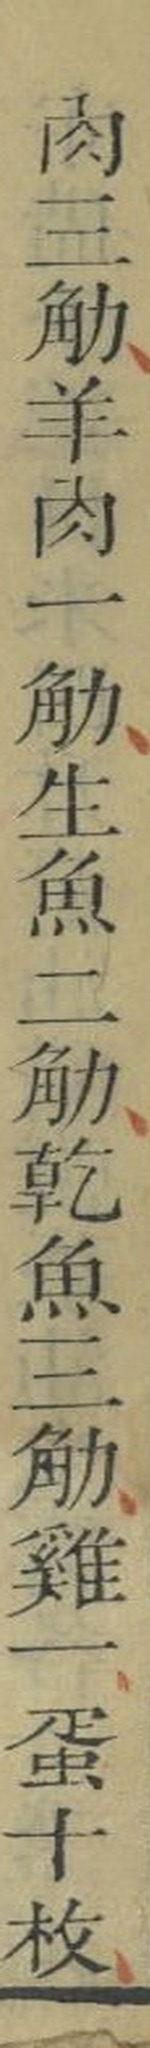肉三觔羊肉一觔生魚二觔乾魚三觔雞一蛋十枚
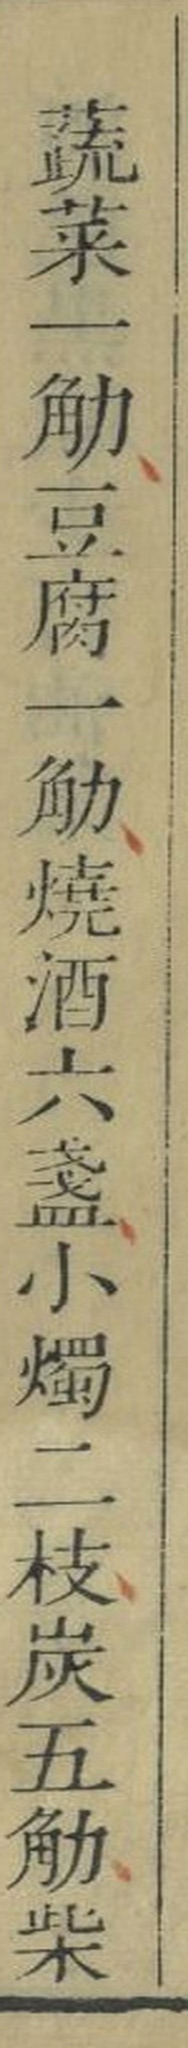蔬菜一觔豆腐一觔燒酒六盞小燭二枝炭五觔柴
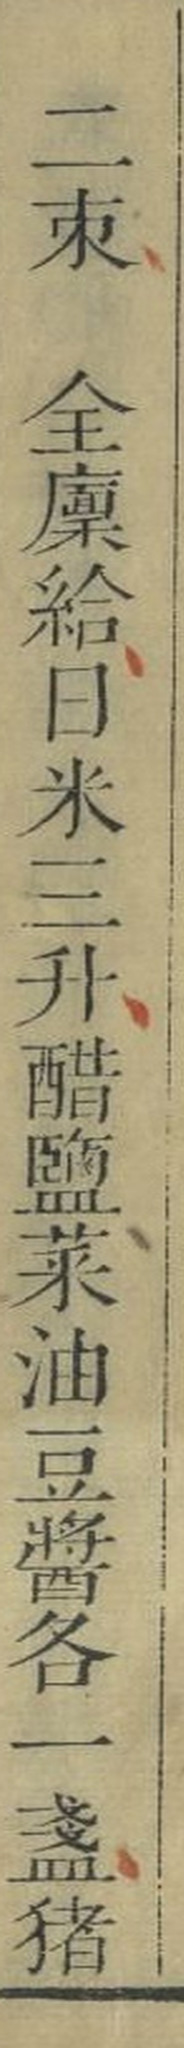二束全廩給日米三升醋鹽菜油豆醬各一盞猪
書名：中山伝信録 巻一、巻二
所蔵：University of the Ryukyus Library
